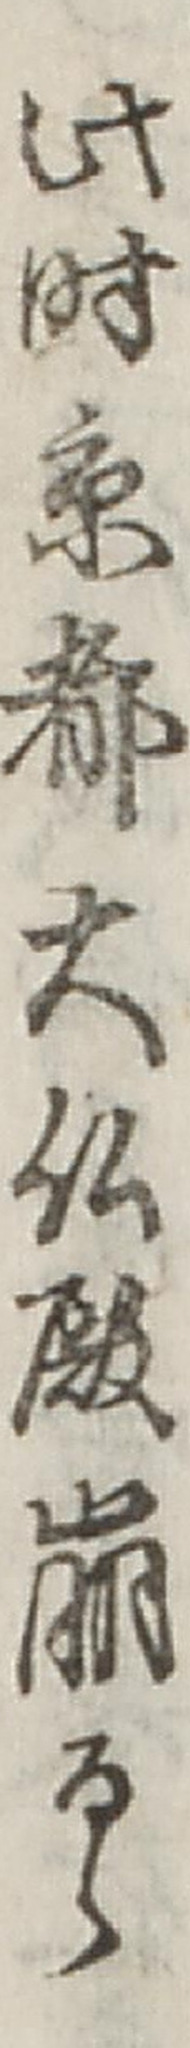此時京都大仏殿崩るゝ
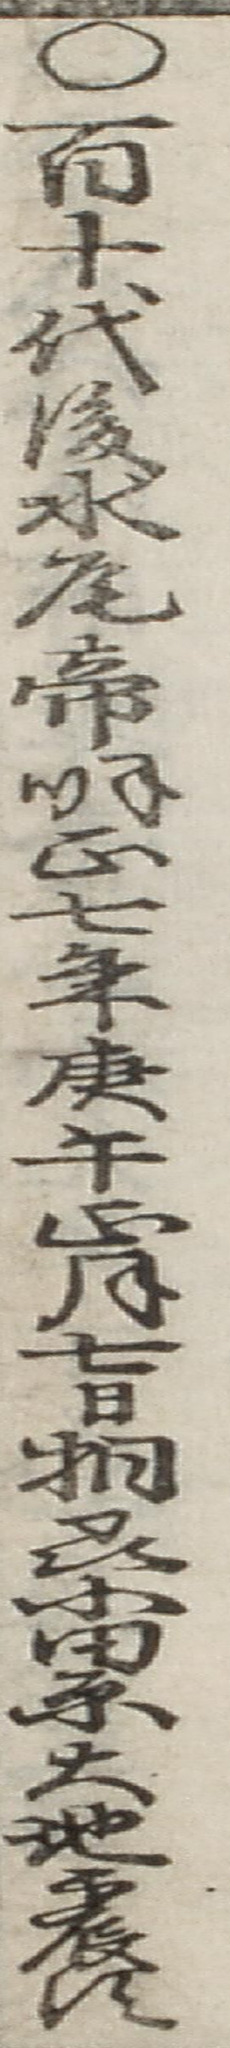○百十代後水尾帝明正七年庚午正月七日相州小田原大地震す
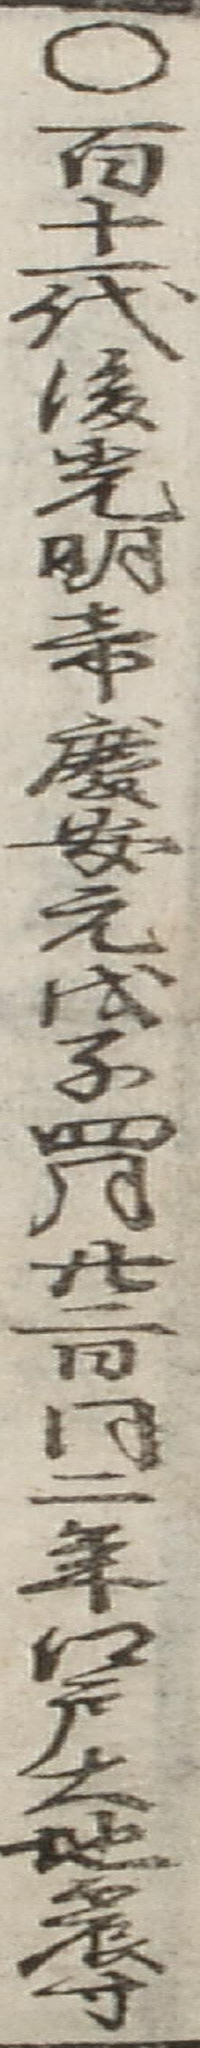○百十一代後光明帝慶安元戌子四月廿二日同二年江戸大地震す
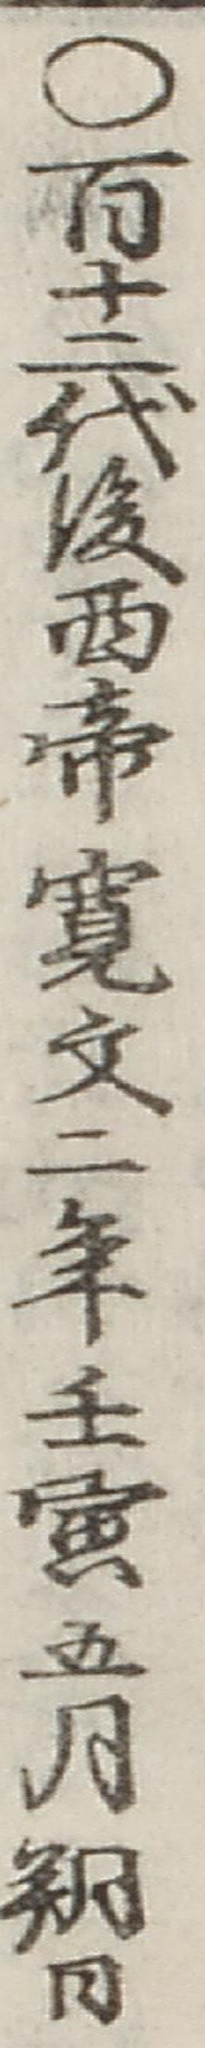○百十二代後西帝寛文二年壬寅五月朔日
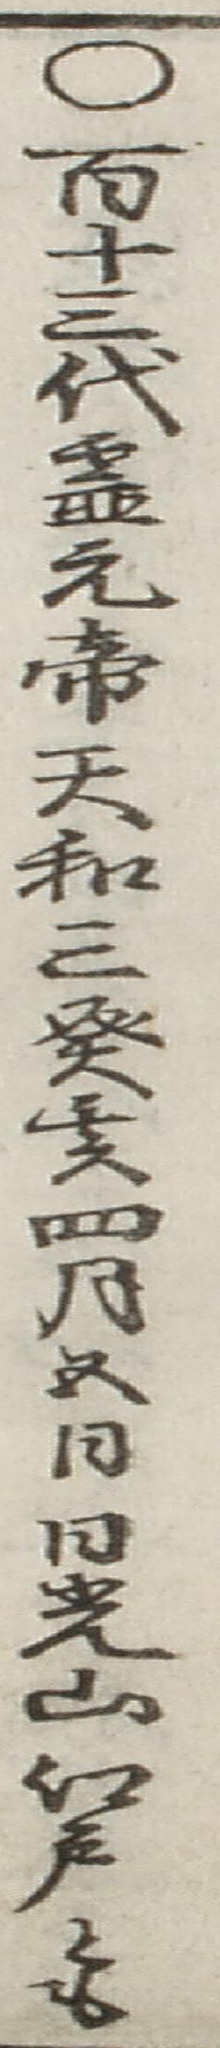○百十三代霊元帝天和三年癸亥四月五日日光山江戸とも
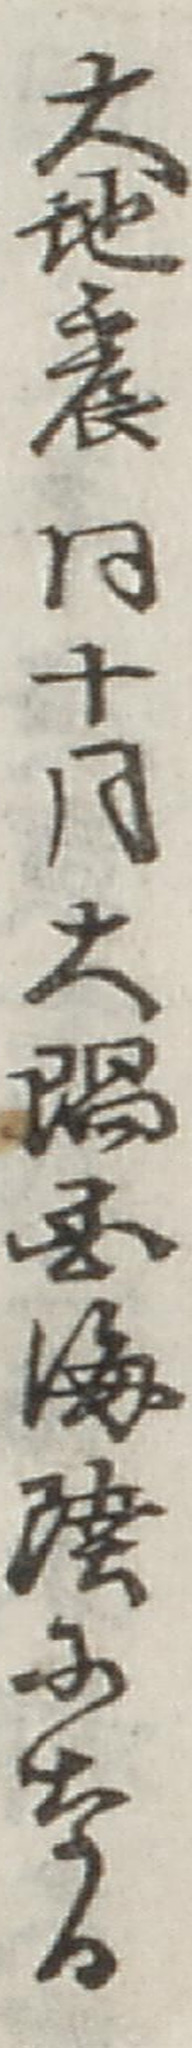大地震同十月大隅国海陸になる
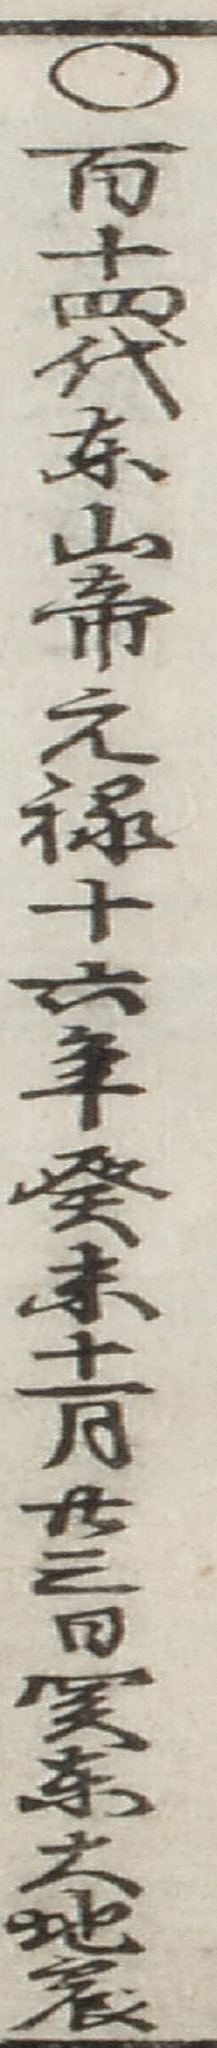○百十四代東山帝元禄十六年癸未十一月廿三日関東大地震
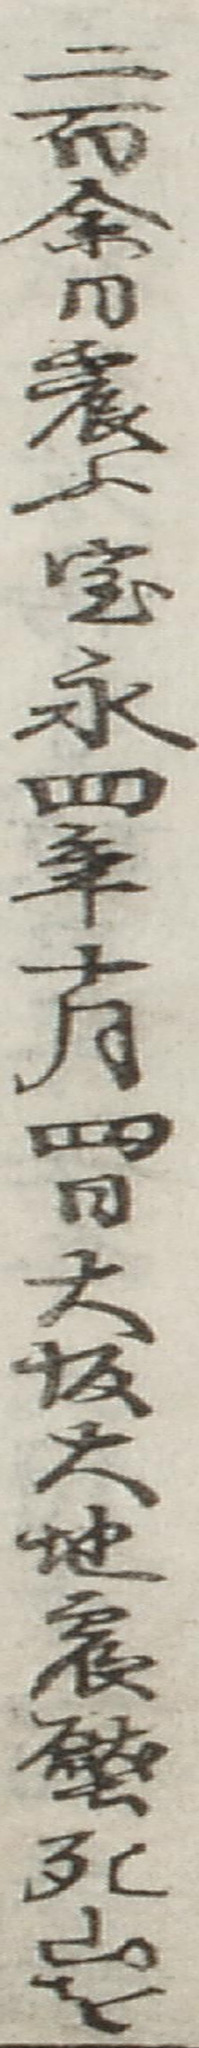二百余日震ふ宝永四年十月四日大阪大地震圧死山を
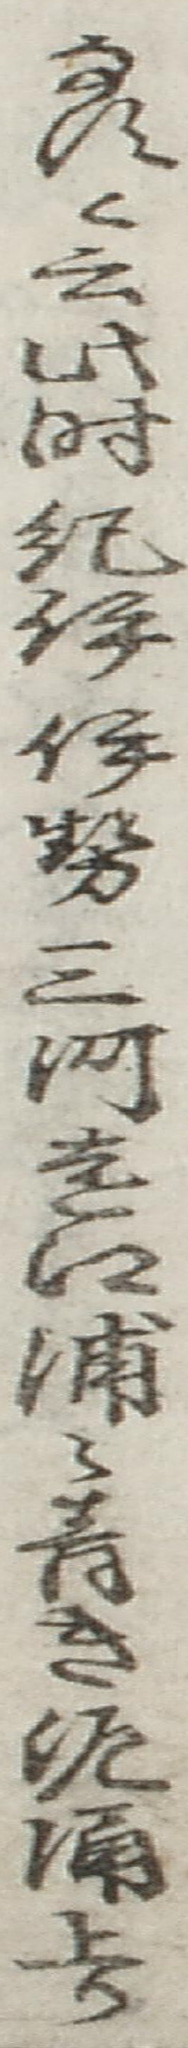なすと云此時紀伊伊勢三河遠江浦々青き泥涌上り
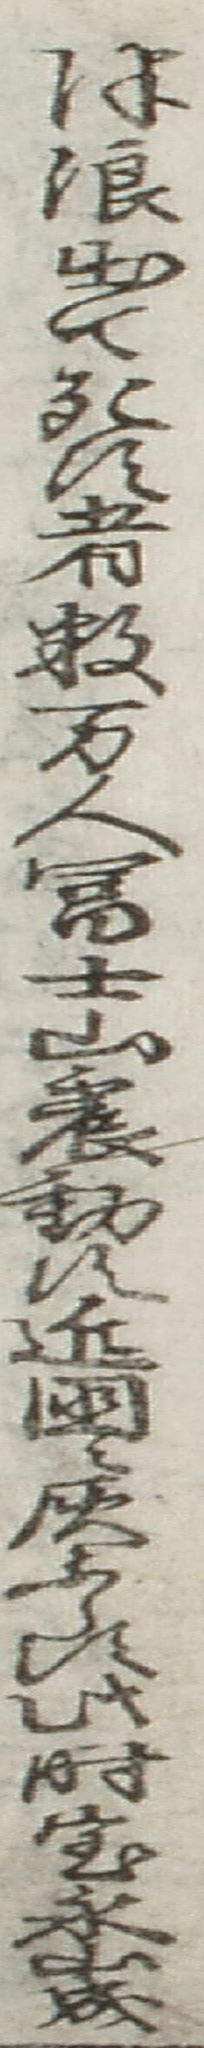津浪出て死す者数万人富士山震動す近国に灰ふらす此時宝永山成
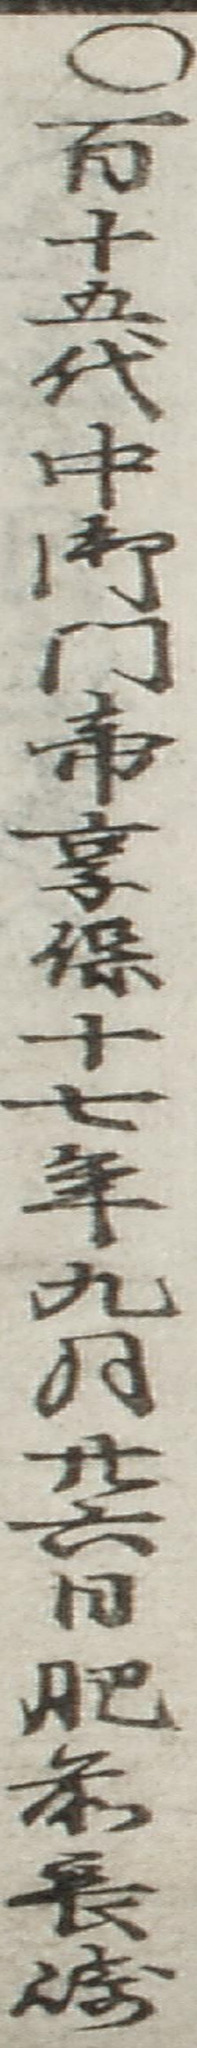○百十五代中御門帝享保十七年九月廿六日肥前長崎
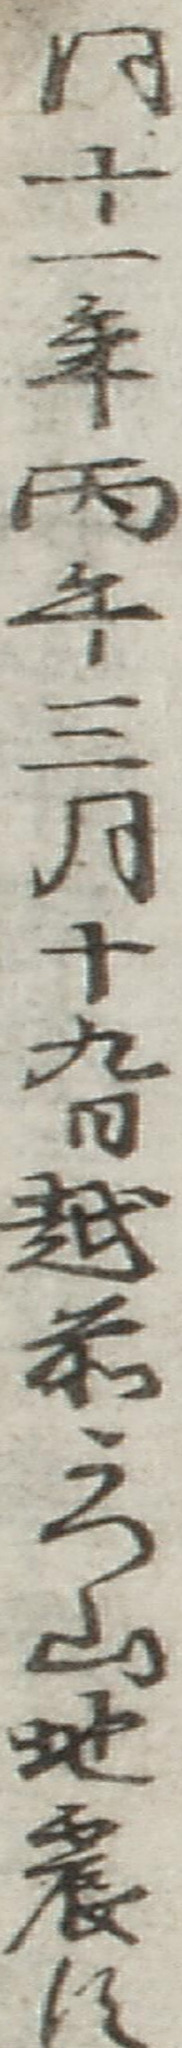同十一年丙午三月十九日越前かつ山地震す

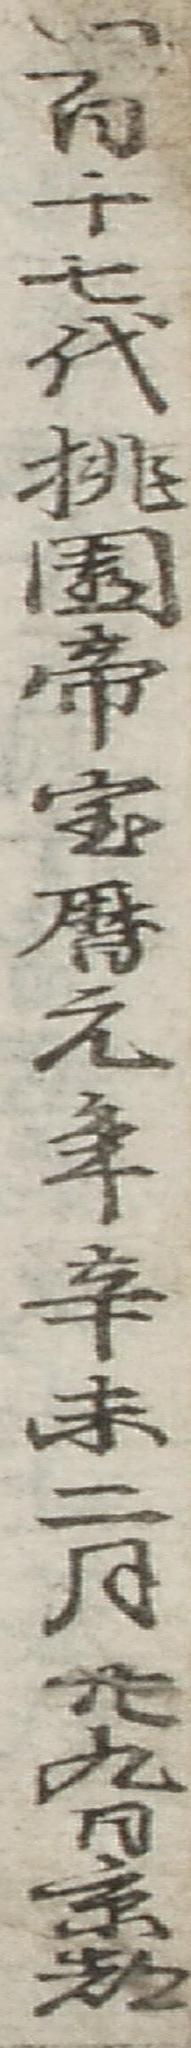○百十七代桃園帝宝暦元年辛未二月廿九日京都
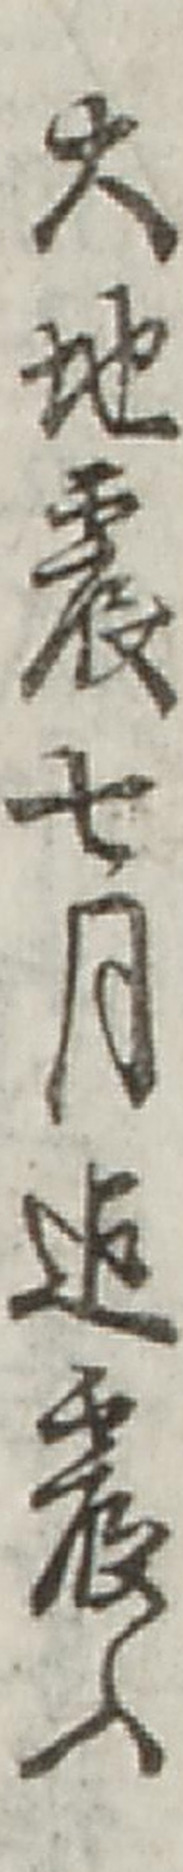大地震七月迄震入
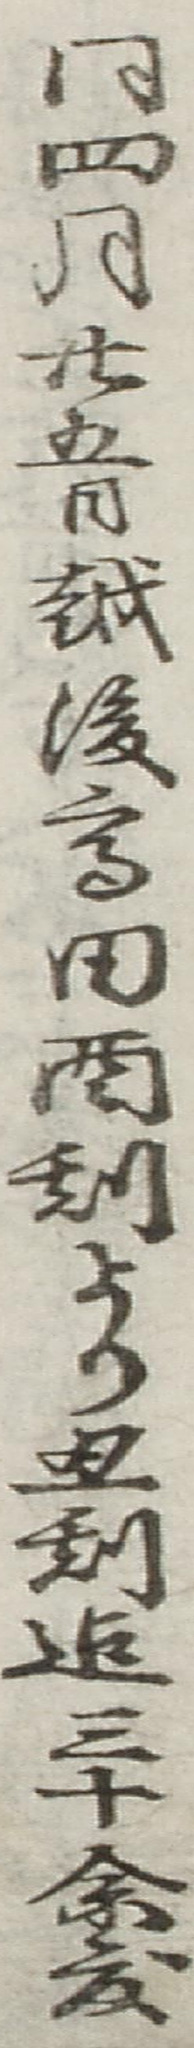同四月廿五日越後高田酉刻より丑刻迄三十余度
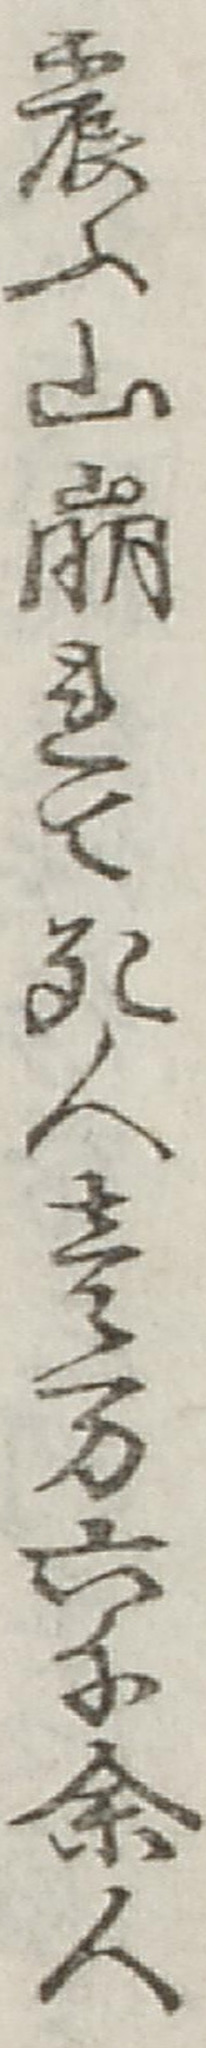震ふ山崩れて死人壹万六千余人
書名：地震世直草紙　全
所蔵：東京大学地震研究所図書室 Earthquake Research Institute Library, The University of Tokyo, JAPAN
